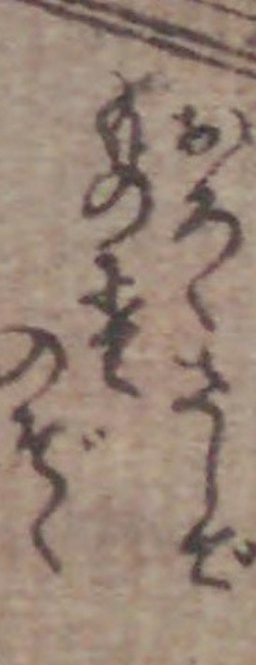ものにて
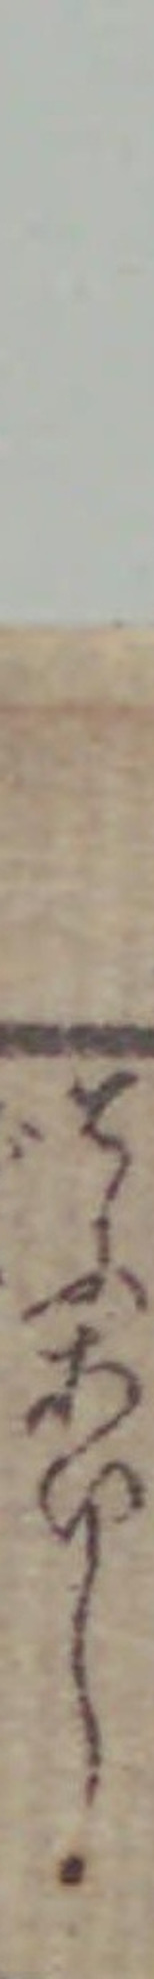てふあいし
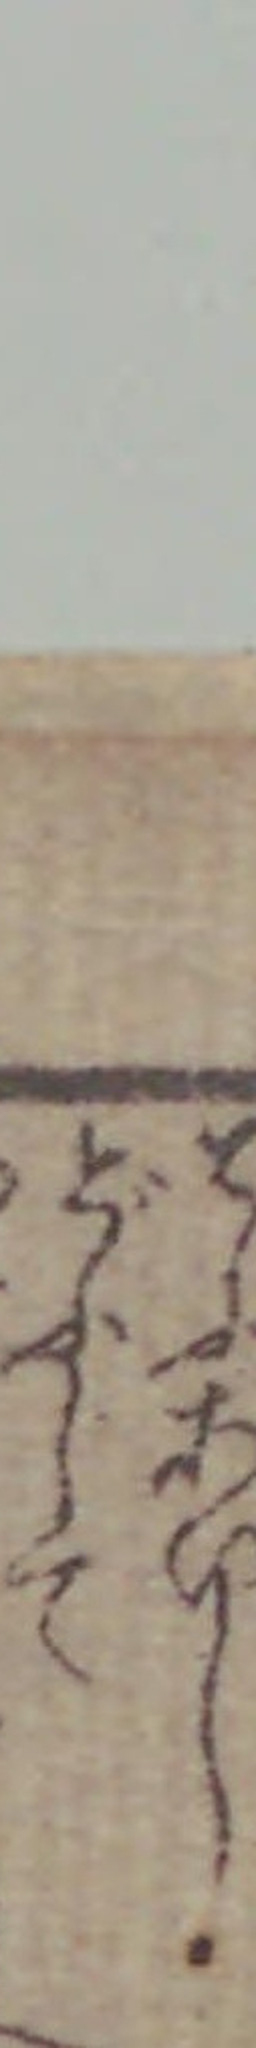どふして
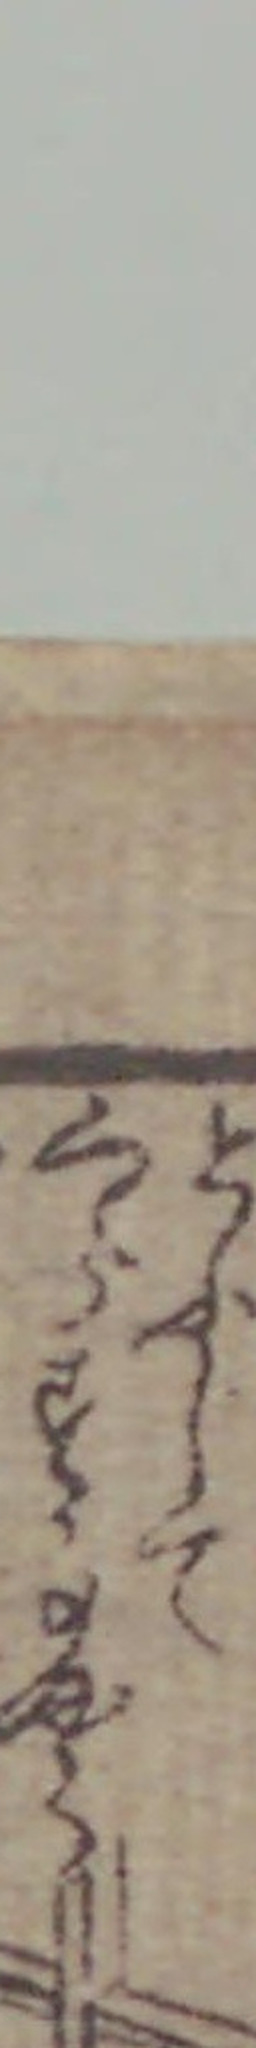くらす事やら
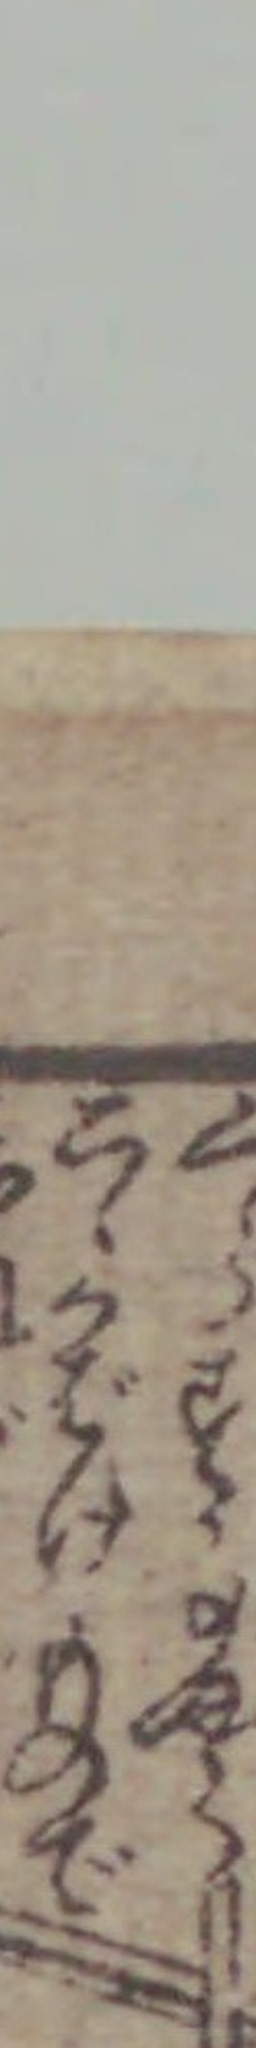こゝかばけもので
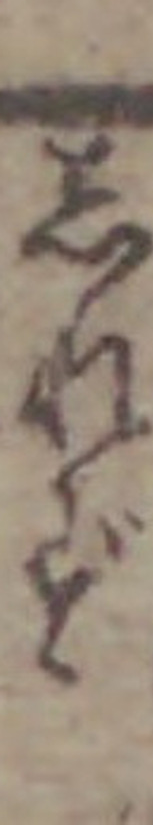しれず
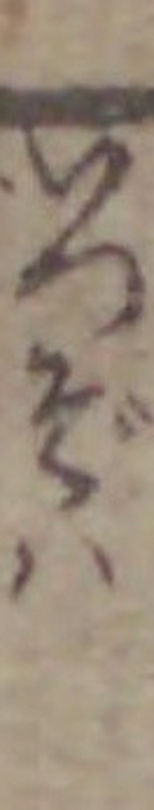いつぞは
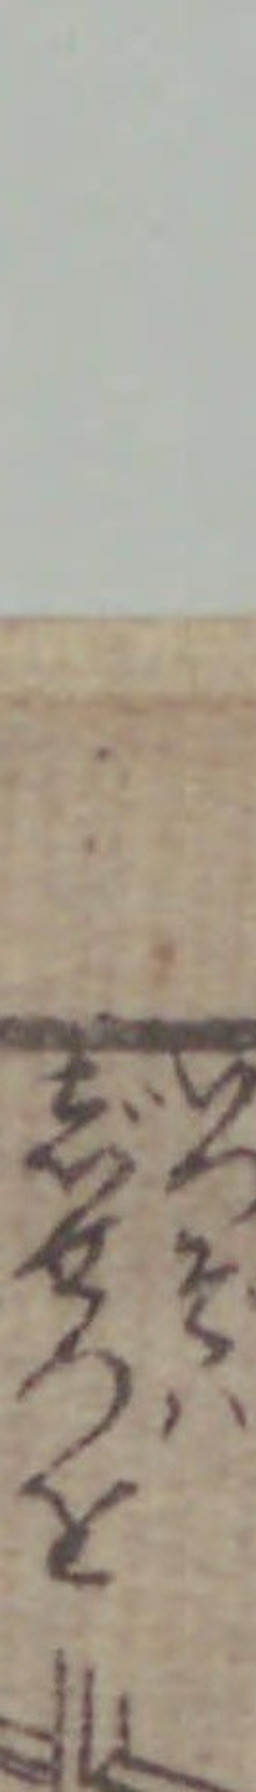じせつを
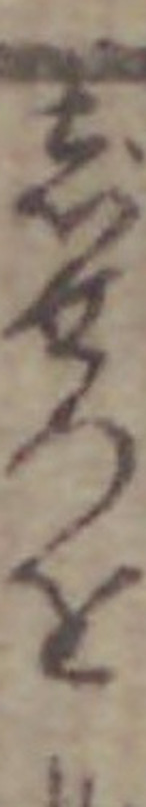じせつを
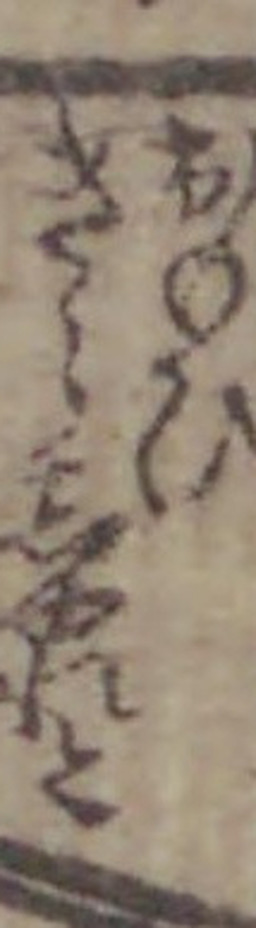きらしやれと
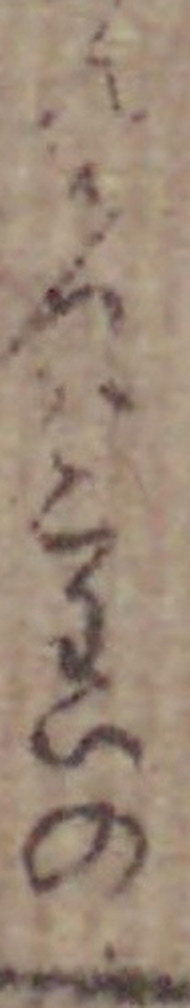にんけんはこわいの
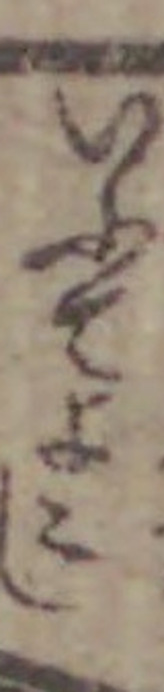いふてよこし
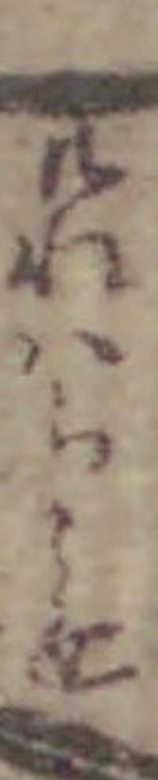けれはちからを
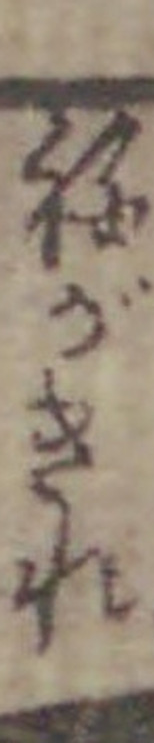ねがきれ
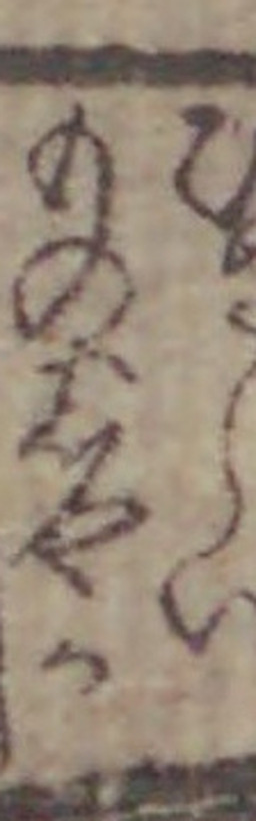ものじやか
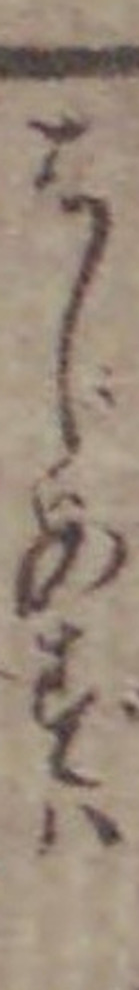はじめずは
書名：化物鼻がひしげ 2巻
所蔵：国立国会図書館 National Diet Library, JAPAN
